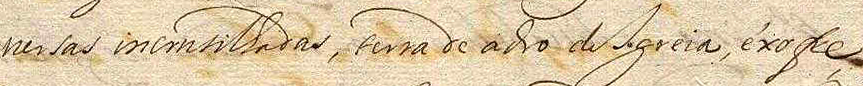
uersas incrusilhadas, terra de adro de Igreia, ēxofre,
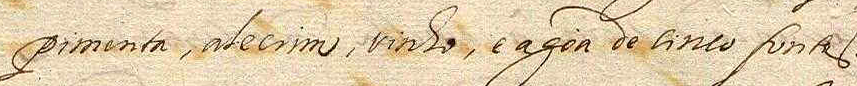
pimenta, alecrim, vinho, e agoa de cinco fontes.
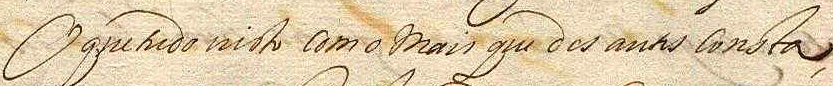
O que tudo uisto com o mais que dos autos consta,
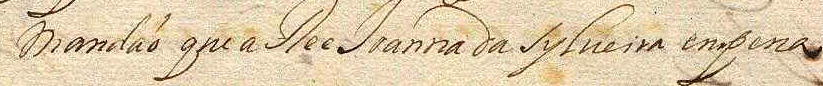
mandaõ que a Ree Joanna da Sylueira em pena
